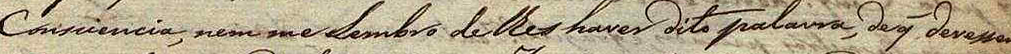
Consciencia, nem me lembro de lhes haver dito palavra, de q̄ devessem
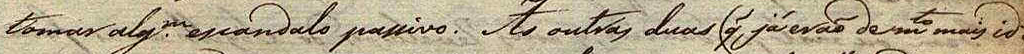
tomar alg.m escandalo passivo. As outras duas (q̄ já eraõ de m.to mais id.
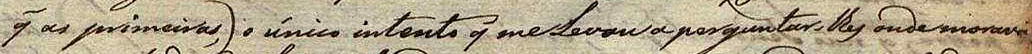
q̄ as primeiras,) o único intento q̄ me levou a perguntar-lhes onde morava
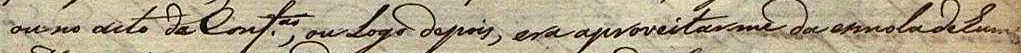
ou no acto da Conf.aõ, ou logo depois, era aproveitar-me da esmola de hum_
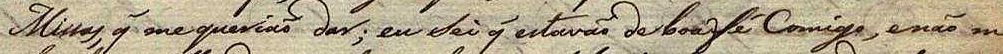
Missas, q̄ me queriaõ dar; eu sei q̄ estavaõ de boa fé Comigo, e naõ me
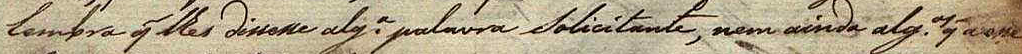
lembra q̄ lhes dissesse alg.a palavra solicitante, nem ainda alg.as q̄ a esse
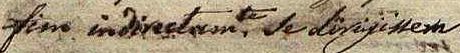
fim indirectam.te se dirigissem.
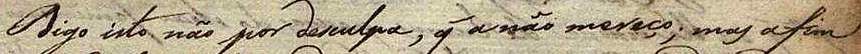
Digo isto naõ por desculpa, q̄ a naõ mereço, mas afim
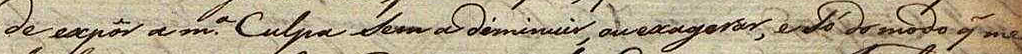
de expôr a m.a Culpa sem a diminuir, ou exagerar, e só do modo q̄ me
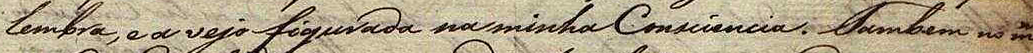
lembra, e a vejo figurada na minha Consciencia. Tambem no m.mo
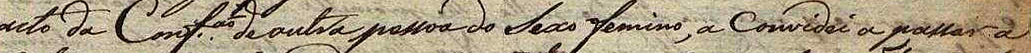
acto da Conf.aõ de outra pessoa do sexo femino, a convidei a passar a
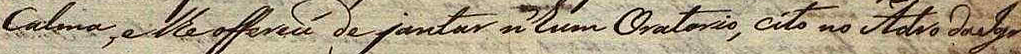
calma, e lhe offerecí de jantar n'hum Oratorio, cito no Adro da Igr.a
